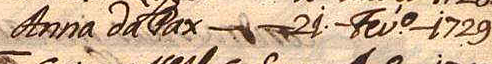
Anna da Pax- - 2i. - Fev.o - i729
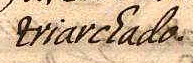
triarchado.
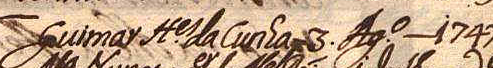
Guimar H.es da Cunha - 3. Ag.o - i747.
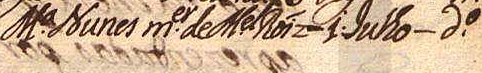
M.a Nunes m.er de M.el Rōiz - i. Iulho - d.o
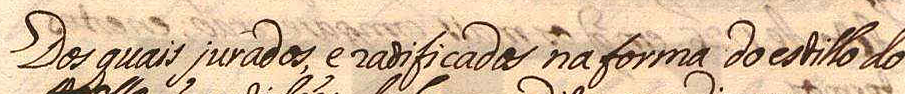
Dos quais jurados, e ratificados na forma do estillo do
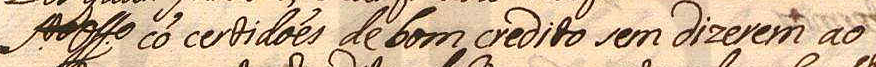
s.to Off.o cō certidões de bom credito sem dizerem ao
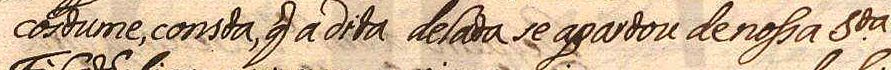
costume, consta, q̄ a dita delata se apartou de nossa S.ta
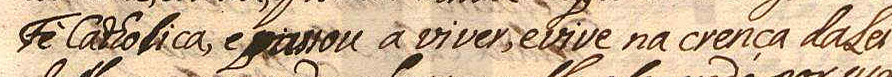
Fé Catholica, e passou a viver, e vive na crença da Lei
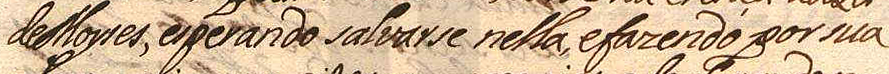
de Moyses, esperando salvarse nella, e fazendo por sua
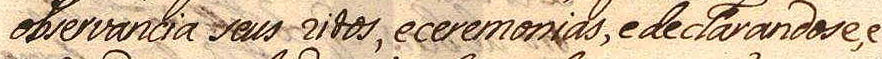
observancia seus ritos, e ceremonias, e declarandose, e
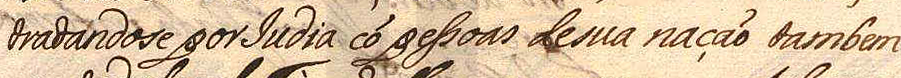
tratandose por Iudia cō pessoas de sua naçaõ tambem
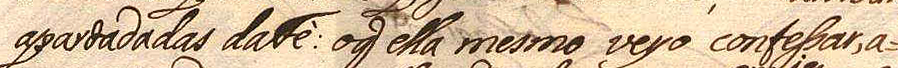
apartadadas da Fé: o q̄ ella mesmo veyo confessar, a
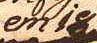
em i8
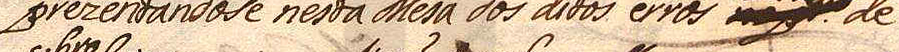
prezentando-se nesta Mesa dos ditos erros _ de
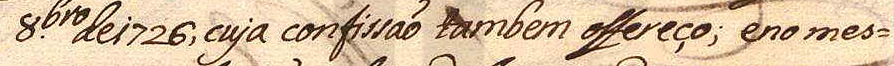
8.bro de i726, cuja confissaõ tambem offereço; e no mes
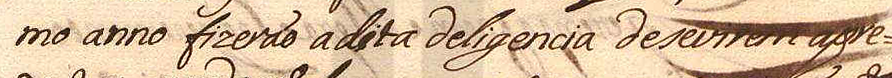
mo anno fizeraõ a dita deligencia de servirem apre
